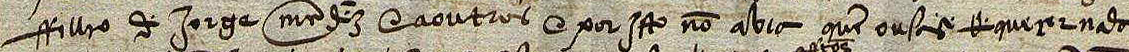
filho de Jorge m̄edez e a outros e por Jsto nō avia quē ousase Requerer nada
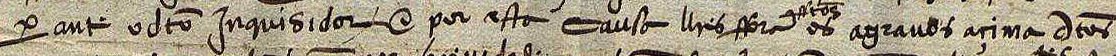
ꝑante o dt̄o Jnquisidor / e por esta Causa lhes fforā fftos os agrauos acima dt̄os
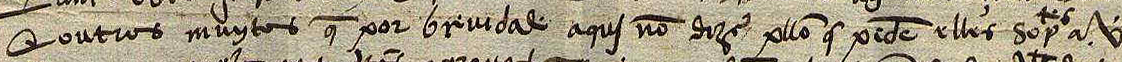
e outros muytos q̄ por breuidade aquJ n̄o dizē p̄llo q̄ pedē elles soptes a V.
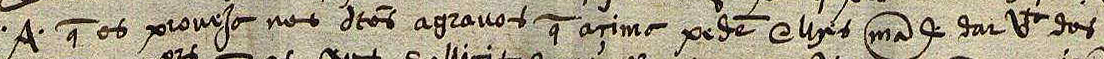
A. q̄ os proueJa nos dtōs agrauos q̄ acima pedē e lhes māde dar vta dos
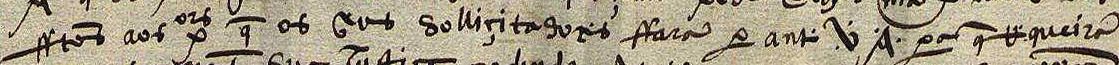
fftos aos pors q̄ os seus sollicitadores ffarā ꝑante V. A. ꝑa q̄ Requeirā
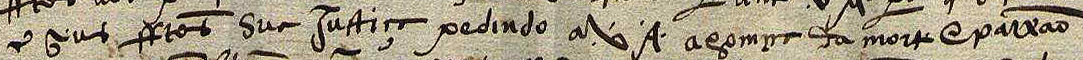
ē seus fftōs sua Justiça pedindo a V. A. a homrra da morte e paixaõ
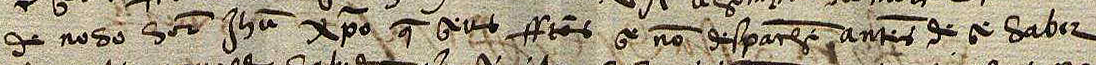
de noso Sor̄ Jhū Xp̄o q̄ seus fftōs se n̄o despachē antes de se saber
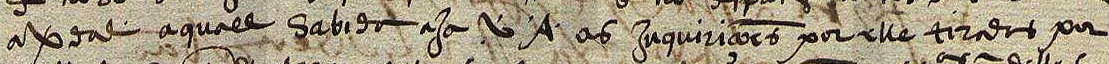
a ꝟdade a quall sabida aJa V. A. as Jnquirições por elle tirados por
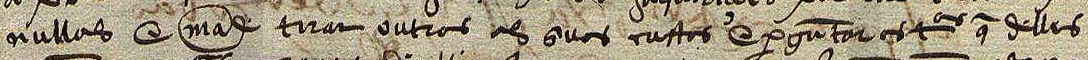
nullas e māde tirar outras as suas custas e ꝑgūtar as tas q̄ delles
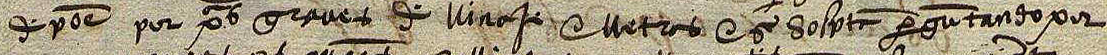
depõe por pas graues de llinaJe e lletras e sē sosptā ꝑḡutando por
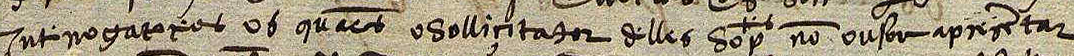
Jnterrogatoreos os quaes o sollicitador delles soptes n̄o ousou apresētar
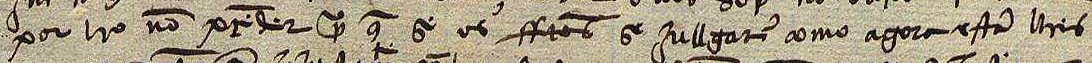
por ho n̄o prēder p̄oq̄ se os fftōs se Jullgarē como agora estā lhes
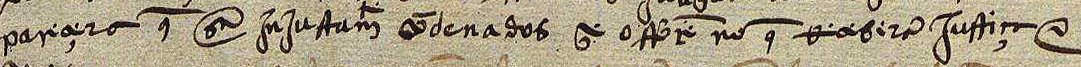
parecera q̄ sā Jnjustamte cōdenados se o ffor̄e no q̄ Receberā Justiça e
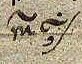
m̄ce /
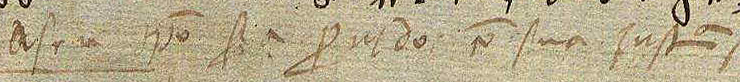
a seu tp̄o ꞩa ꝓujdo cō sua Justa /
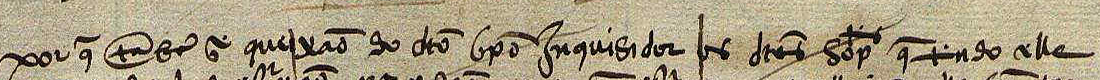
porq̄ tābē se queixão do dtō bpō Jnquisidor os dtōs soptes q̄ tendo elle
